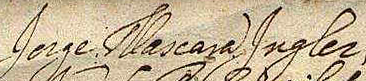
Jorge Mascara Jnglez,
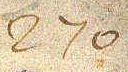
270
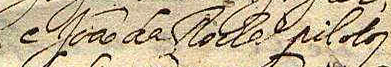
e João da Rocha pilotos
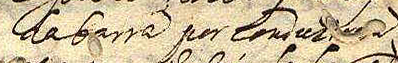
da barra por conduz
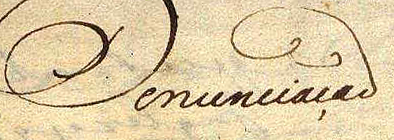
Denunciação
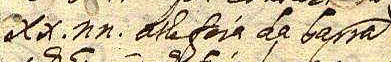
xx. nn. athe fora da barra
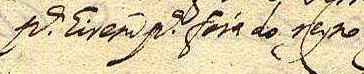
p.a hirem p.a fora do reyno
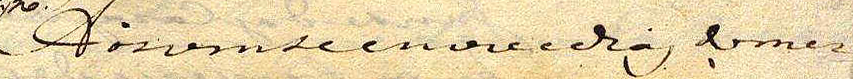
Aoz vite e noue dias do mes
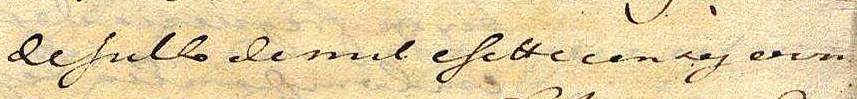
de Julho de mil e settecentos e vin
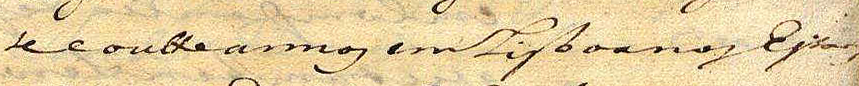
te e outto annos em Lisboa nos Estaos
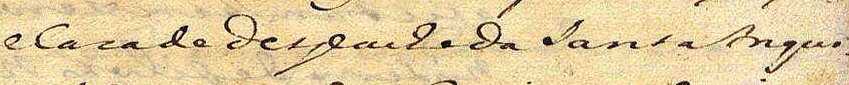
e Caza do despacho da Santa Inqui
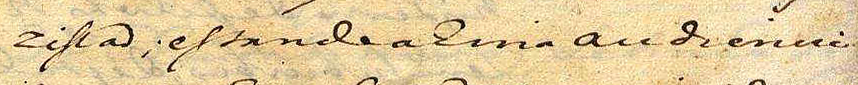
zissaõ; estando ahi na audiencia
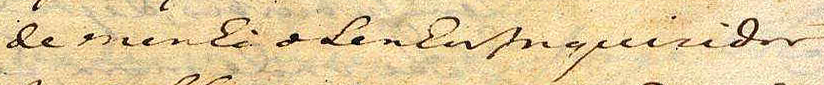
de menhã o Senhor Jnquizidor
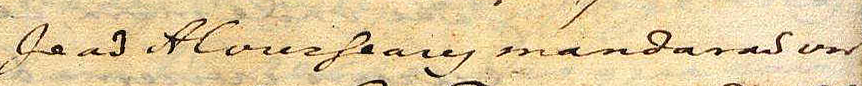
Joaõ Alvrez soares mandaraõ vir
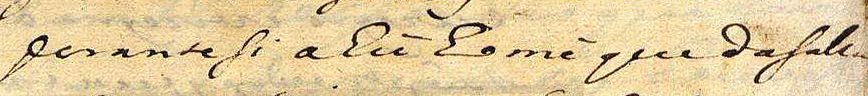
perante si a hū homē que da salla
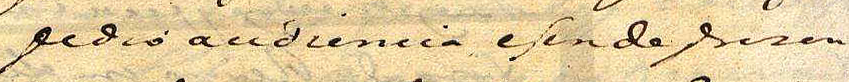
pedio audiencia, e sendo prezen
